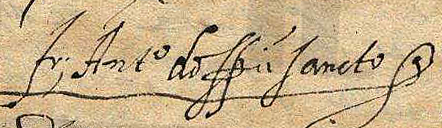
fr; Anto do spū sancto
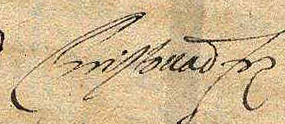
Christouaõ frz̄
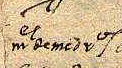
mel de medros
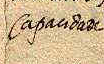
Capacidade
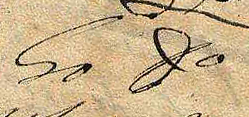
ho Do
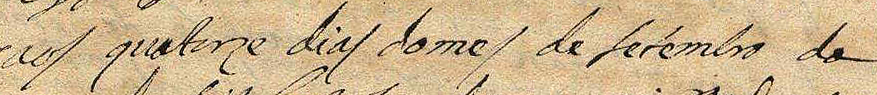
aos quatorze dias do mes de setembro da
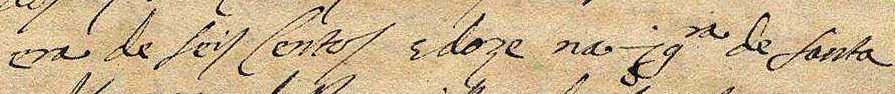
era de seisCentos E doze na jgra de santa
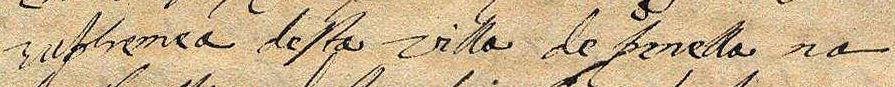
Euphemea desta villa de penella na
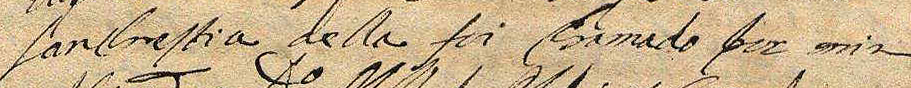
sanchrestia della foi Chamado por min
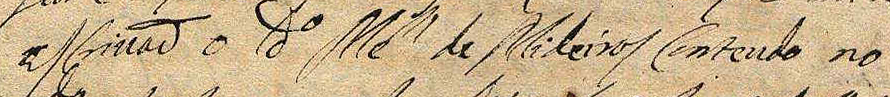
EsCriuão o ldo Mell de Mideiros Conteudo no
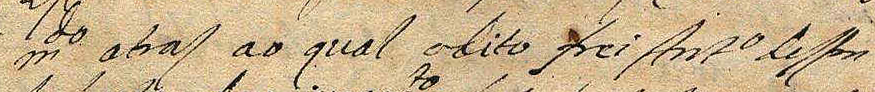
mdo atras ao qual o dito frei Anto do spri
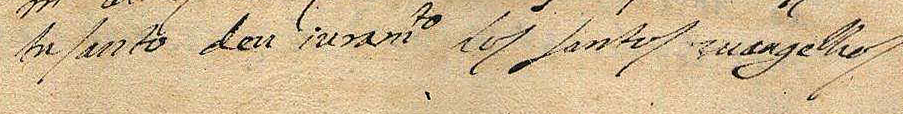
tu santo deu iuramto dos santos Euangelhos
